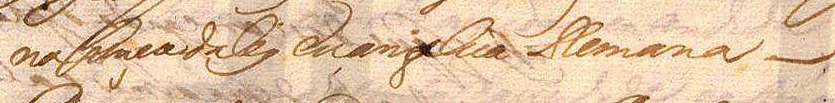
na Crença da ley euangelica Romana -
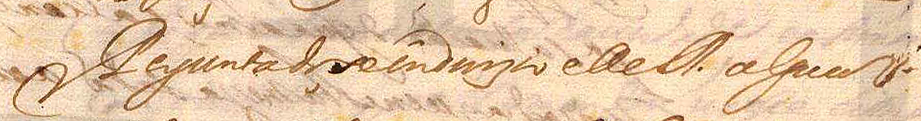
item Peguntado se induzio elle R. alguā
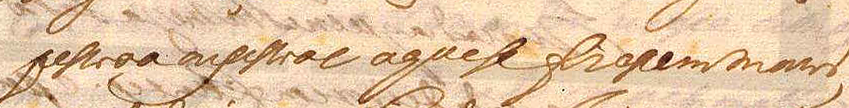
pessoaa ou pessoas a que se fizessem mouros
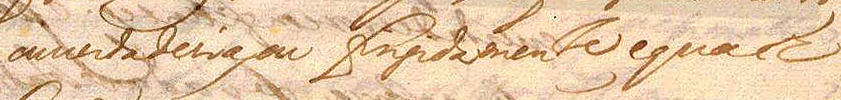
ou uerdadeira, ou fingidamente, e quaes
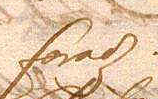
foraõ?
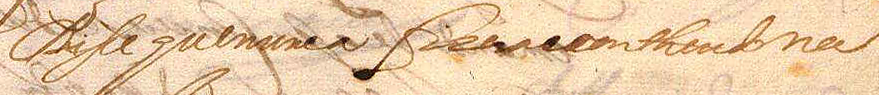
Disse que nunca fizera o contheudo na
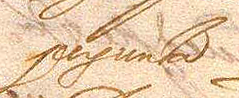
pergunta
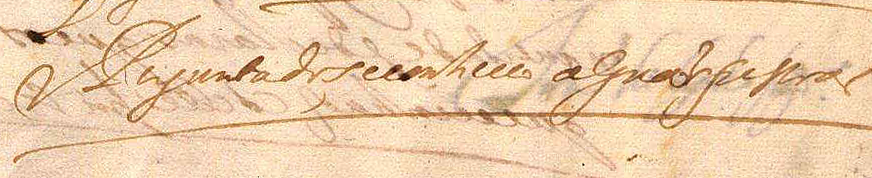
item Perguntado se conheceo alguās pessoas
